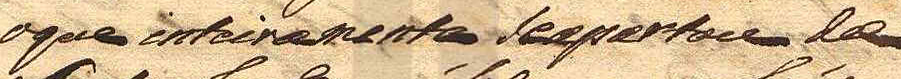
o que inteiramente se apartou da
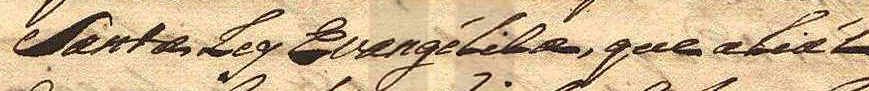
Santa Ley EvangéLiCa, que aliás
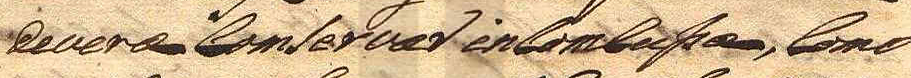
devera comservar inComCussa, Como
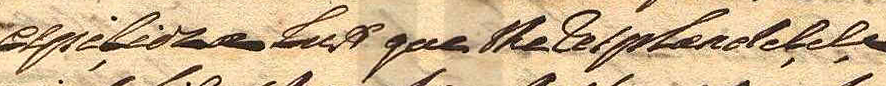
espiÇioza Lux que lhe ResplandeÇeÇe
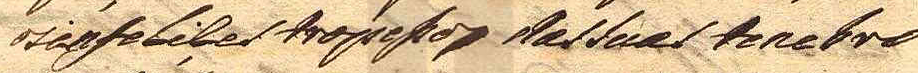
os infeLiÇes tropessos das suas tenebro
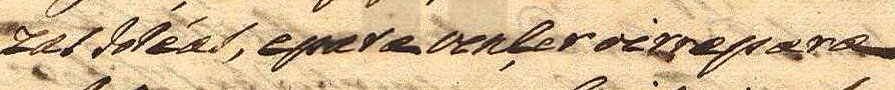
zas Idéas, e para venÇer o irrepara
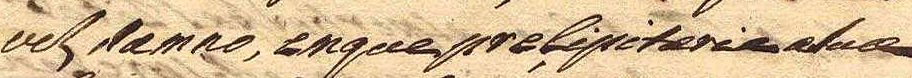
vel damno, em que preÇipitaria a sua
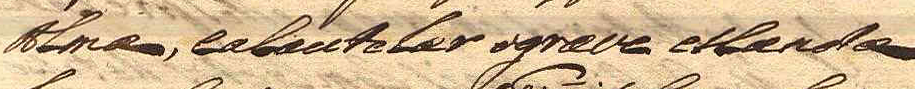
Alma, e aCautelar o grave esCanda
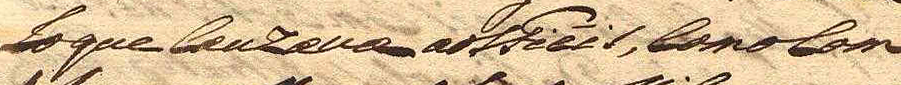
lo que Cauzava aos Fiéis, Como Com
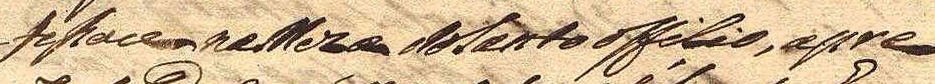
fessou na Meza do Santo offiÇio, a pre
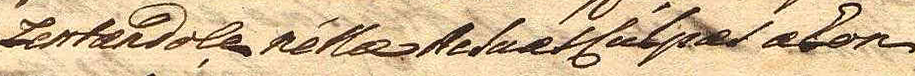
zentandoÇe nélla de suas Culpas a hon
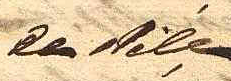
de diçe
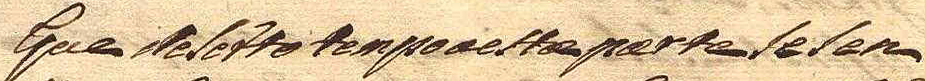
Que de serto tempo a esta parte se sen
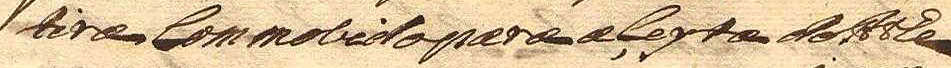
tira Commovido para a Çeyta do Athe
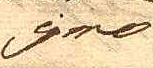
esmo
